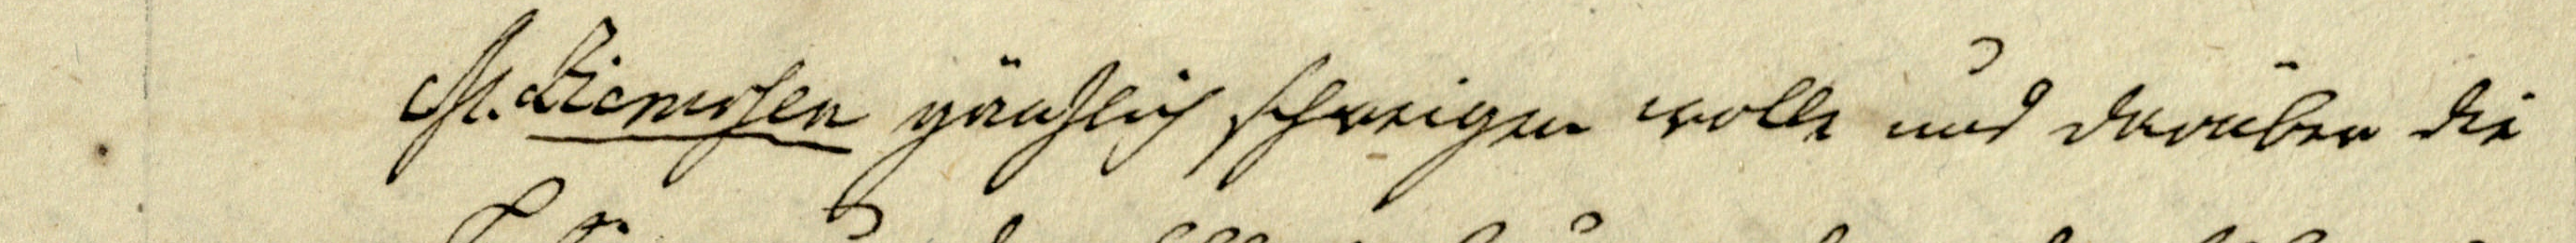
M. Ziemssen gänzlich schweigen wolle und darüber die
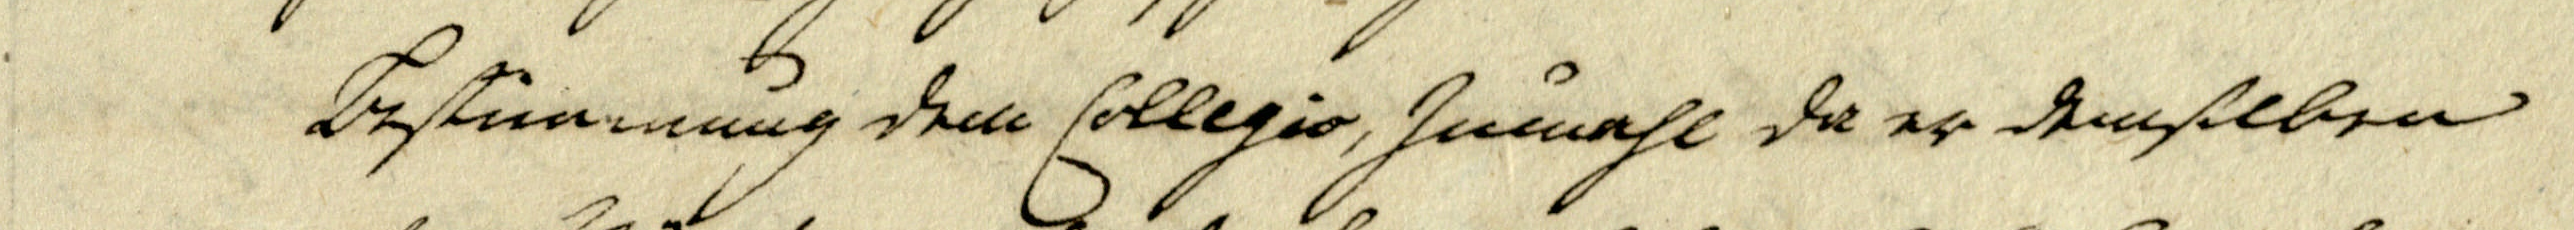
Bestimmung dem Collegio, zumahl da er demselben
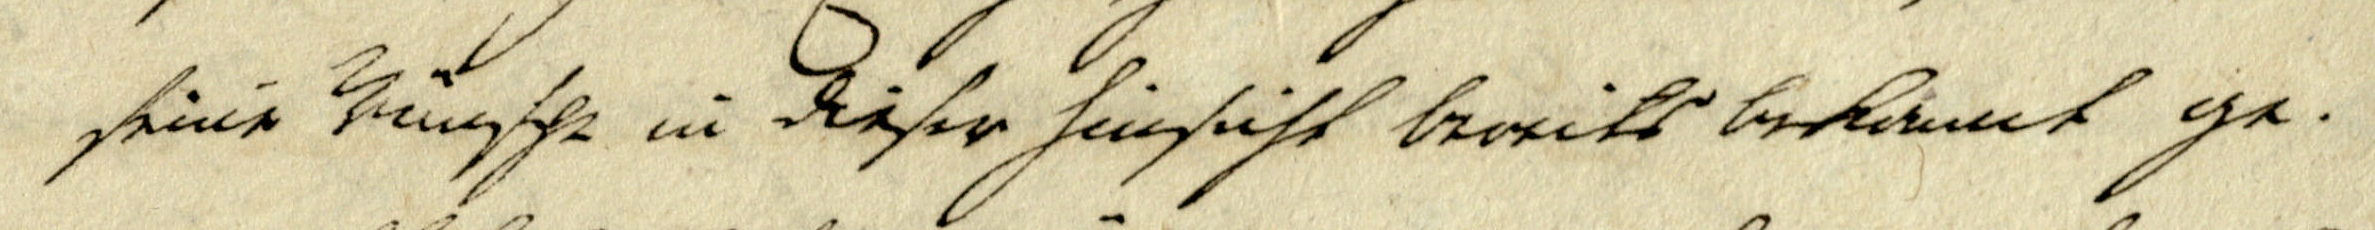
seine Wünsche in dieser hinsicht bereits bekannt ge¬
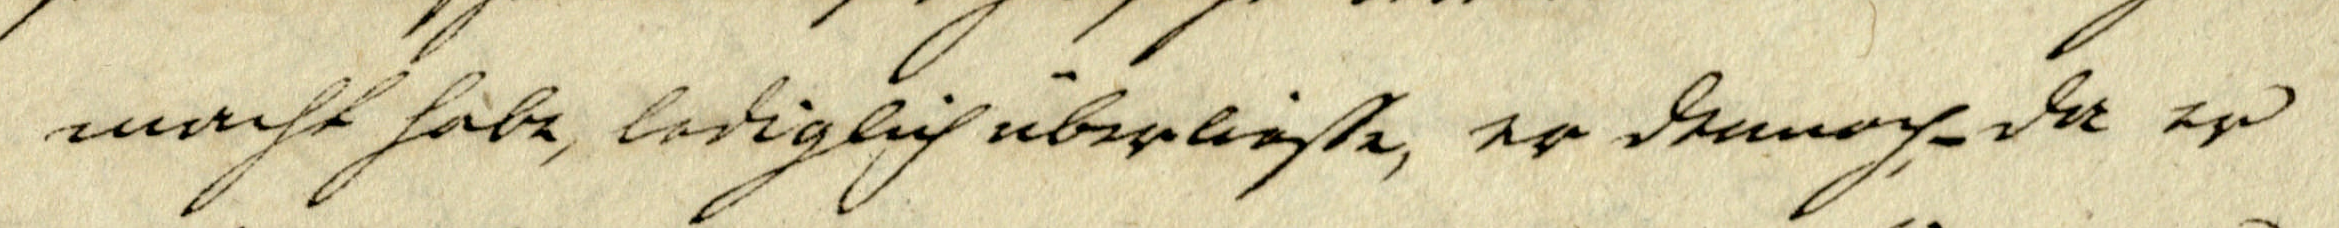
macht habe, lediglich überliesse, er dennoch, da er
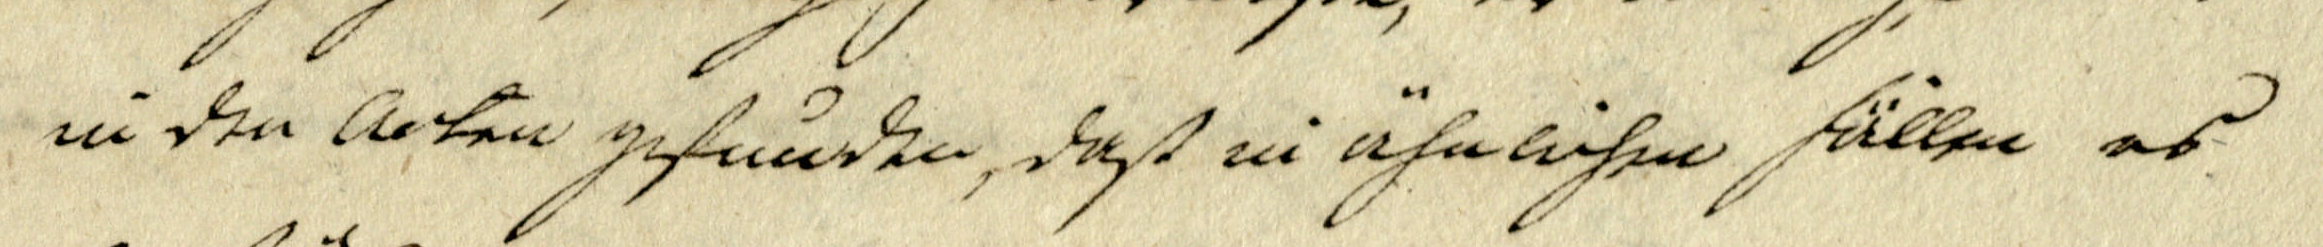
in den Acten gefunden, daß in ähnlichen Fällen es
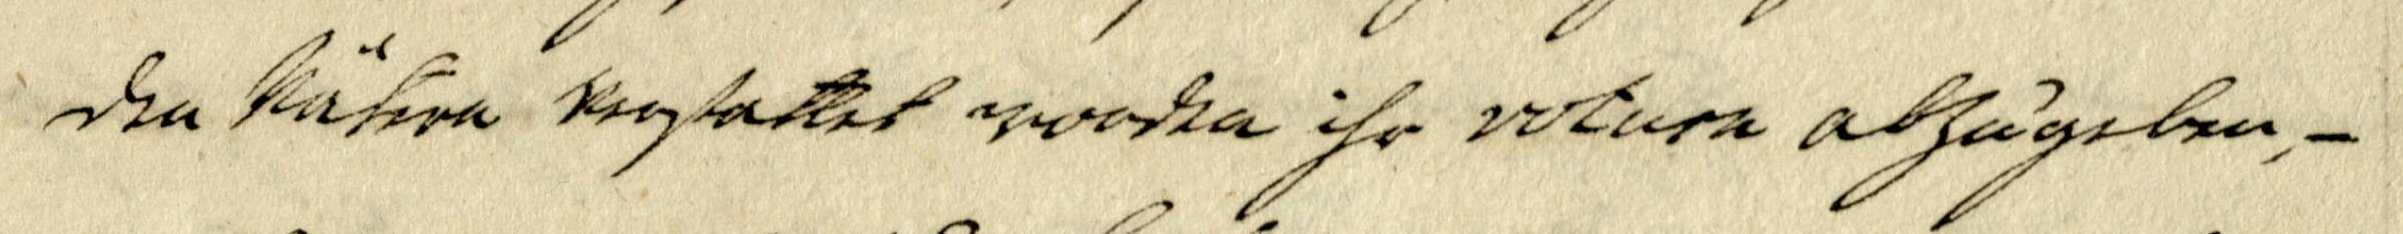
den Vätern verstattet worden ihr votum abzugeben,
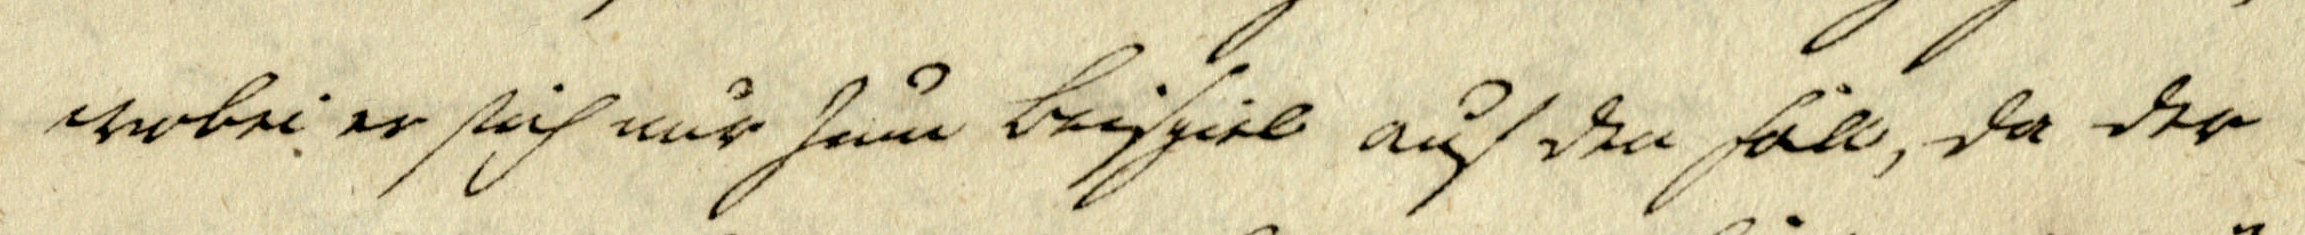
wobei er sich nur zum Beispiel auf den Fall, da der
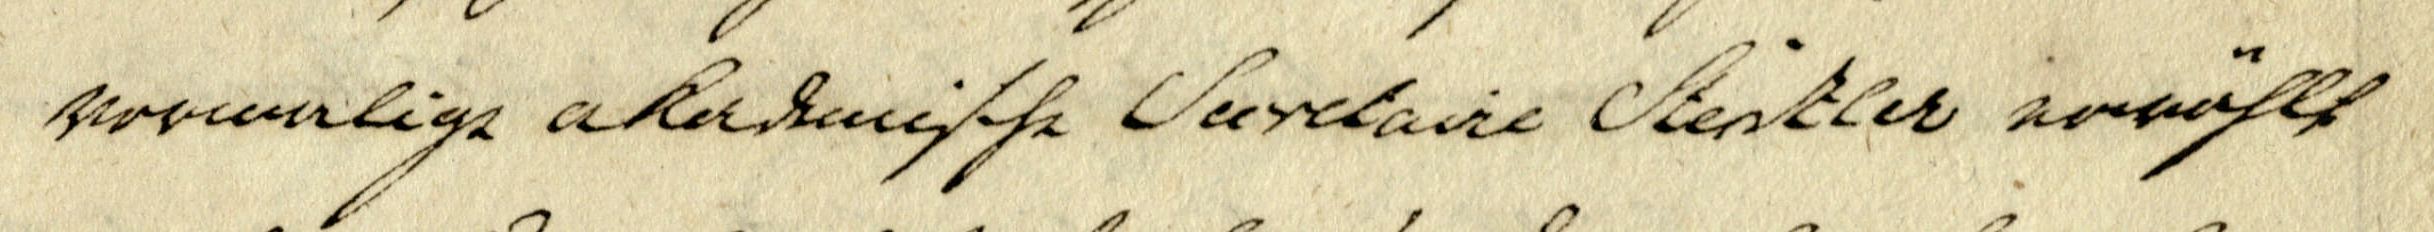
vormalige akademische Secretaire Stenzler erwählt
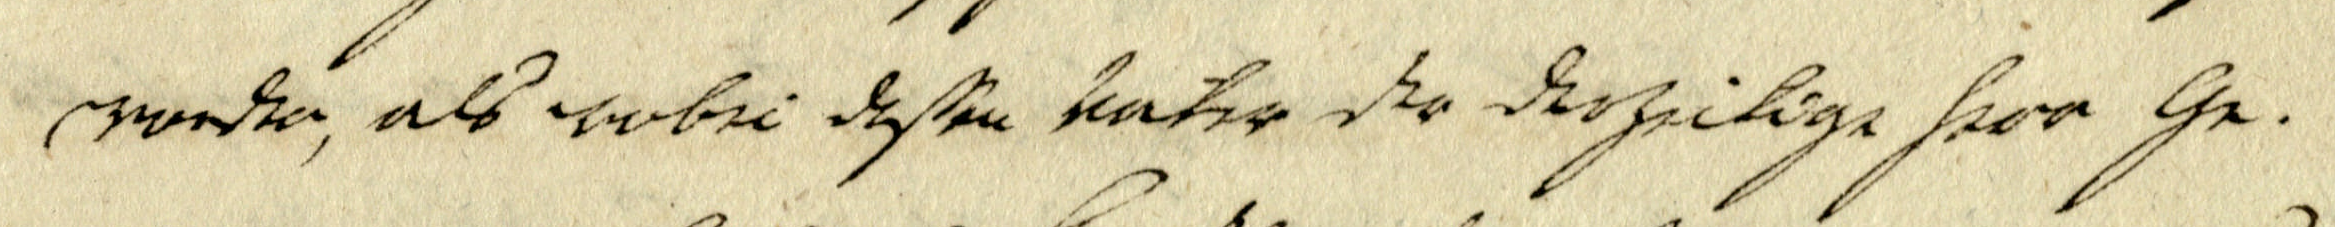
worden, als wobei dessen Vater der derzeitige herr Ge¬
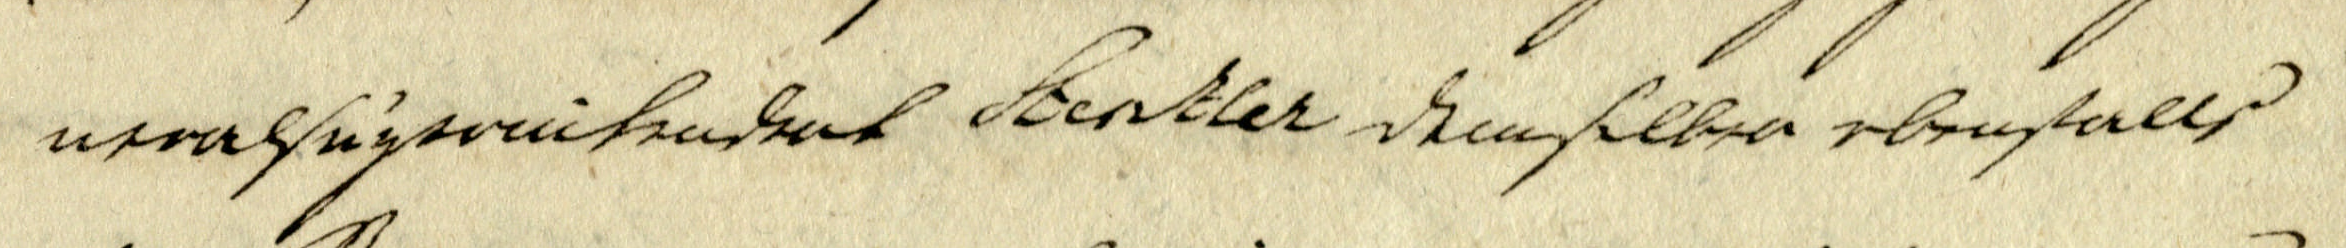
neralsuperintendent Stenzler demselben ebenfalls
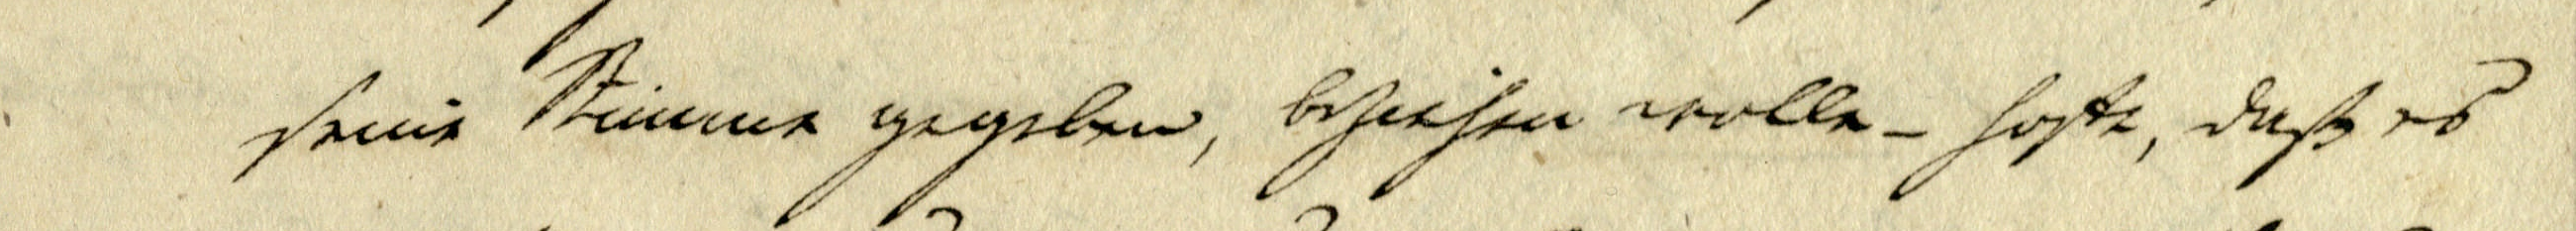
seine Stimme gegeben, beziehen wolle. hofte daß es
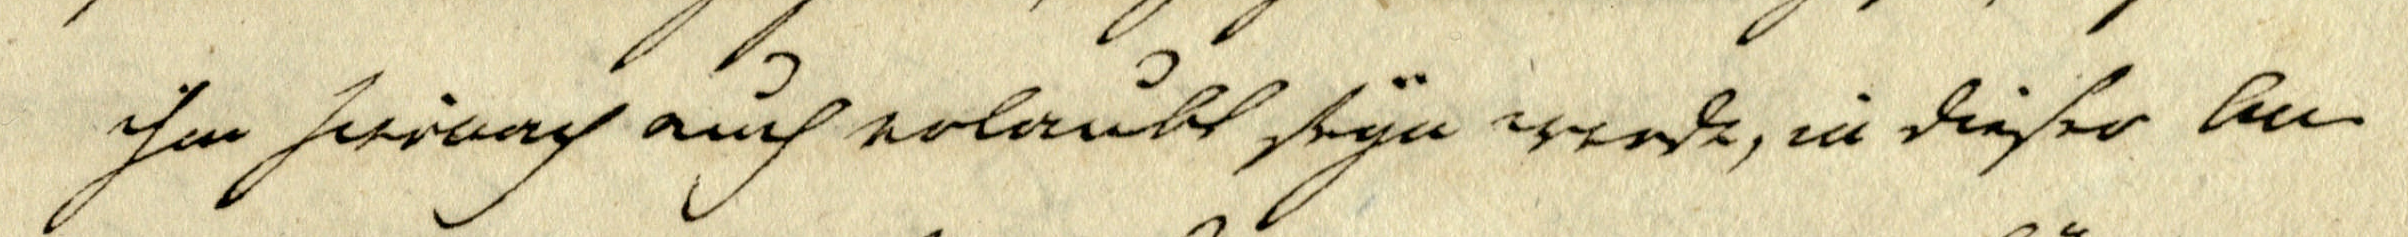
ihm hiernach auch erlaubt seÿn werde, in dieser An¬
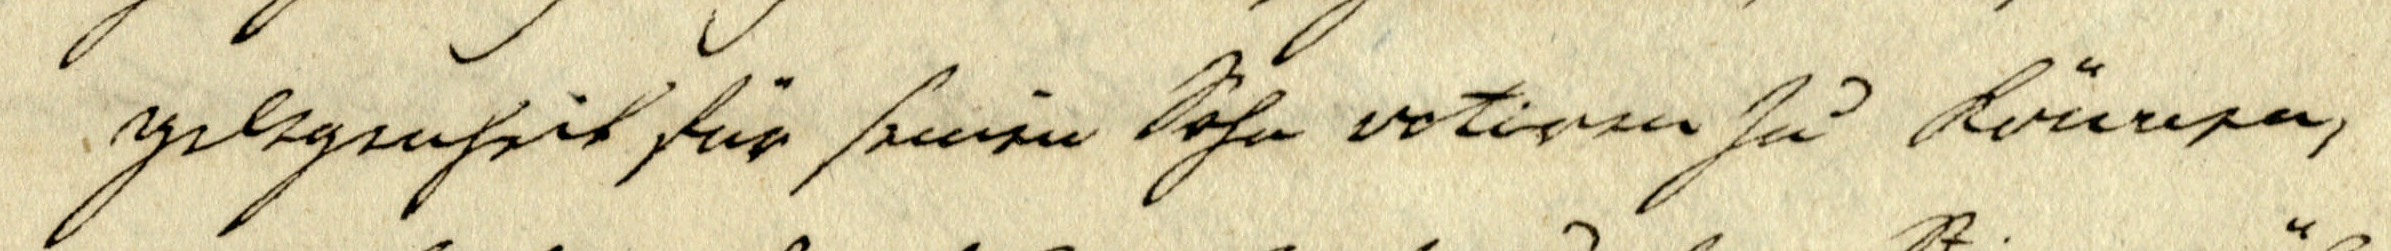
gelegenheit für seinen Sohn votiren zu können,
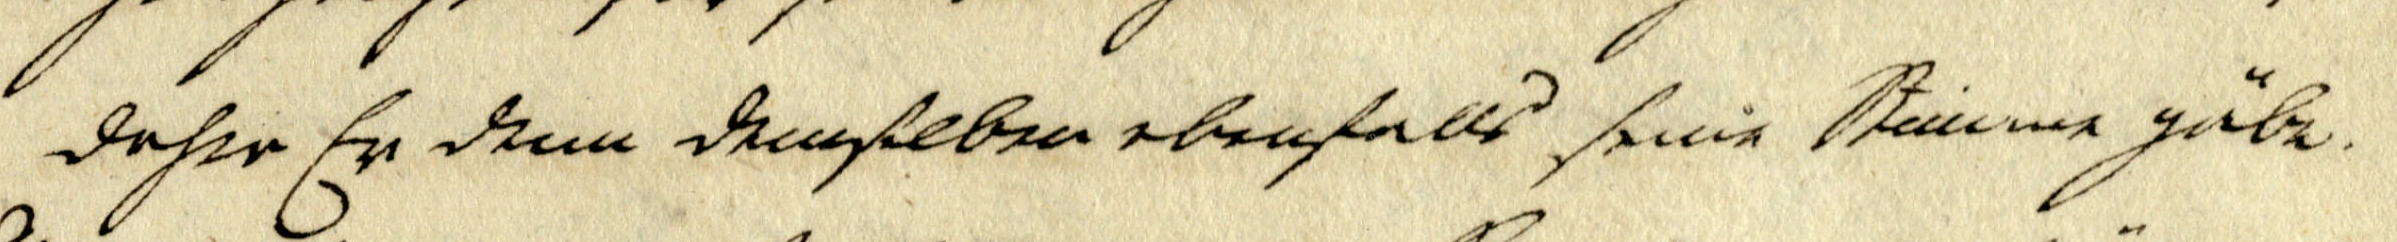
daher Er denn demselben ebenfalls seine Stimme gäbe.
